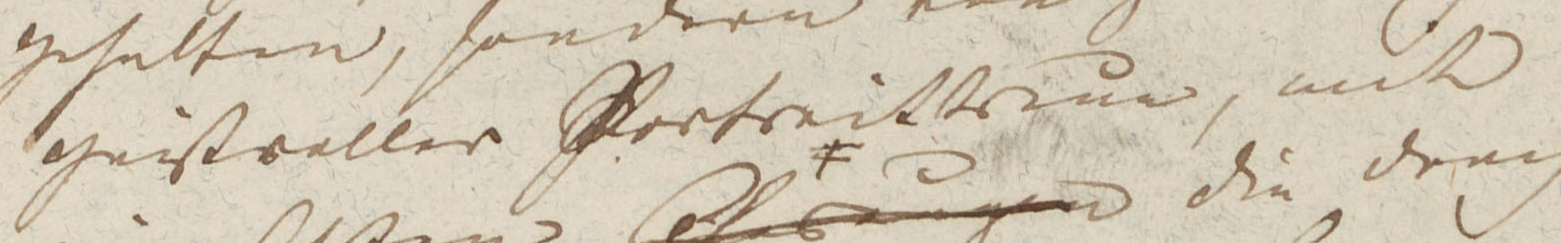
geistvoller Portraittreue, mit
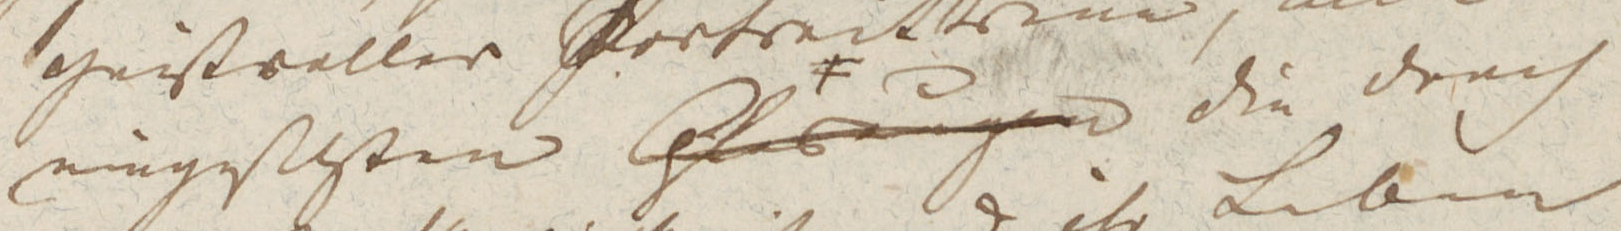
eingesetzten Glasaugen % die durch
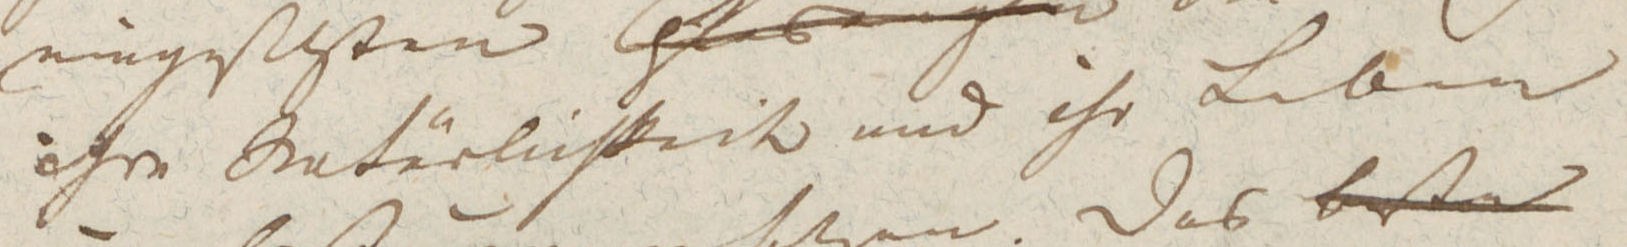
ihre Natürlichkeit und ihr Leben
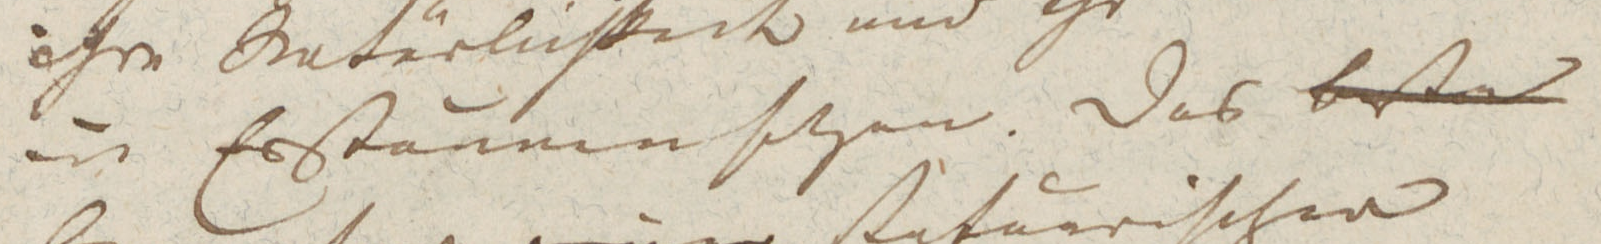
in Erstaunen setzen. Das beste
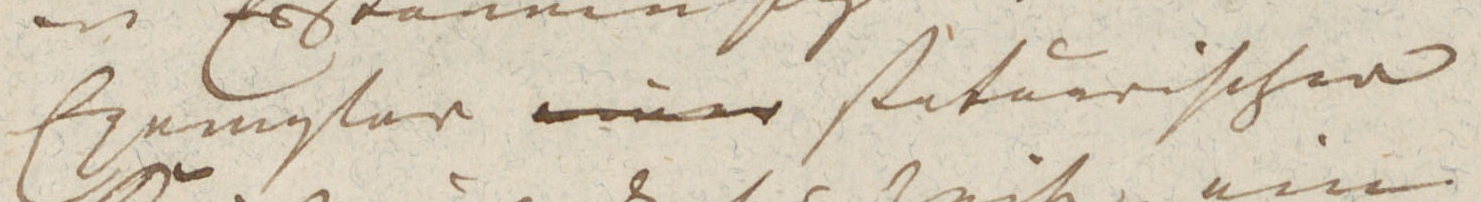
Exemplar einer statuarischer
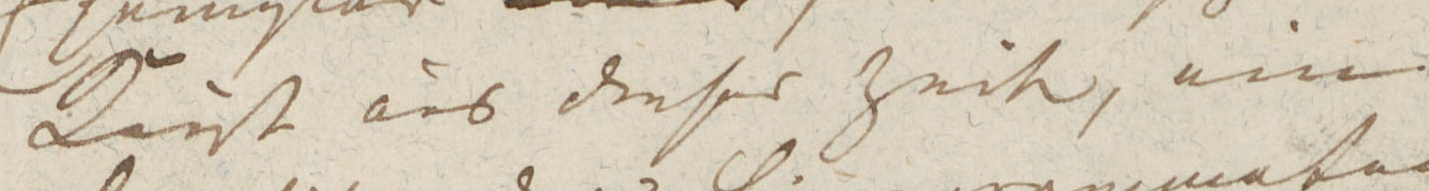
Kunst aus dieser Zeit, ein
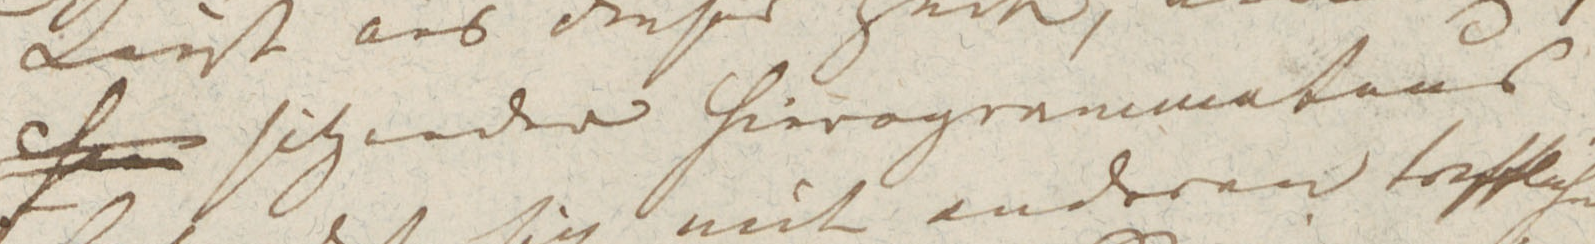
Hie sitzender Hierogrammateus %
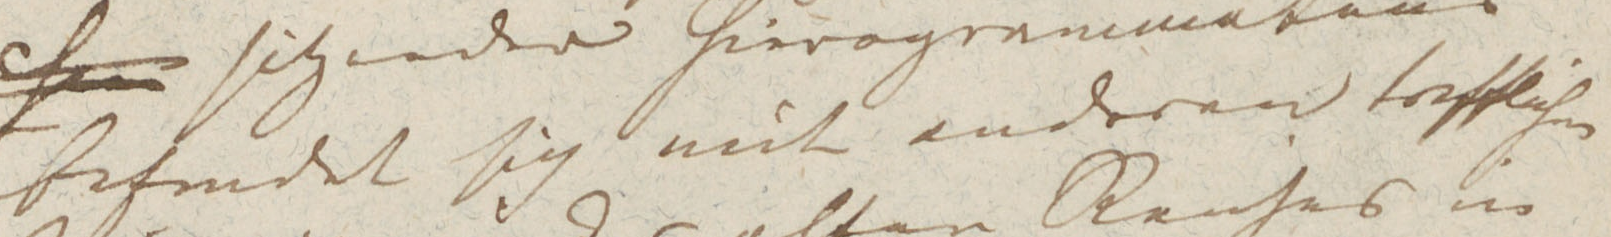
befindet sich mit anderen trefflichen
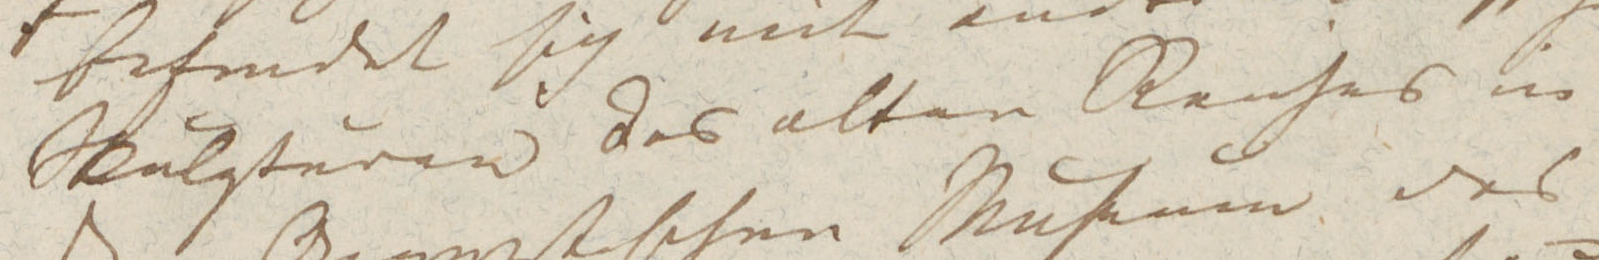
Skulpturen des alten Reiches in
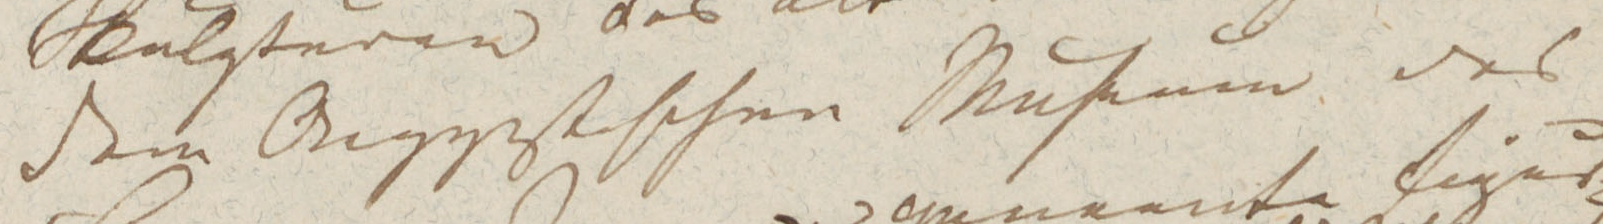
dem Aegyptischen Museum des
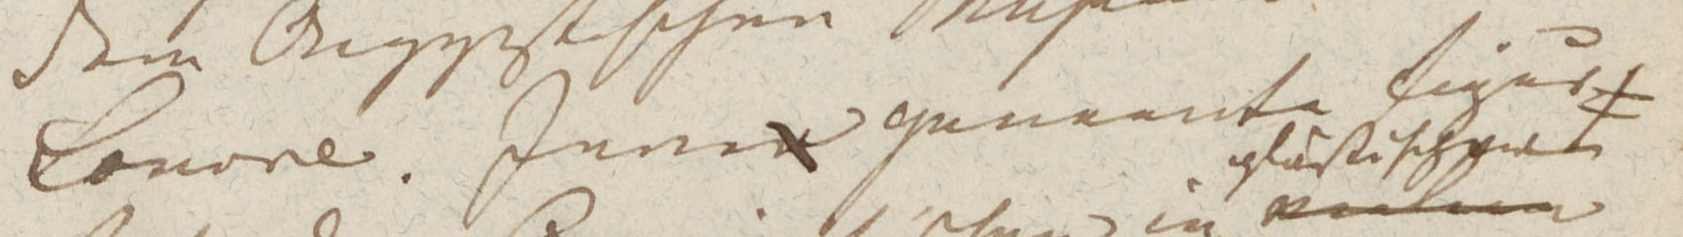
Louvre. Jener genannte Figur
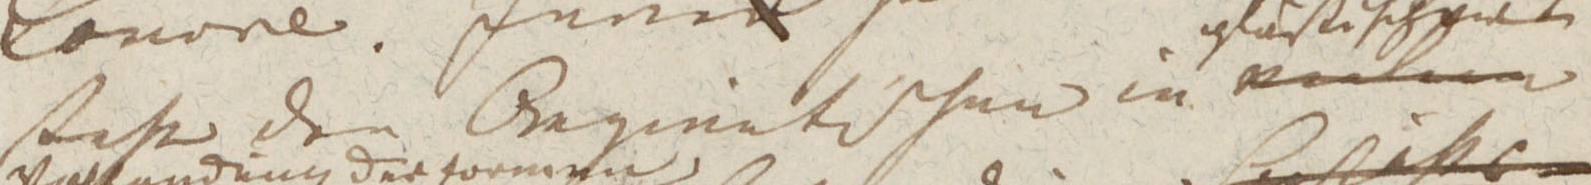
steht den Aeginetischen in vielem plastischer %
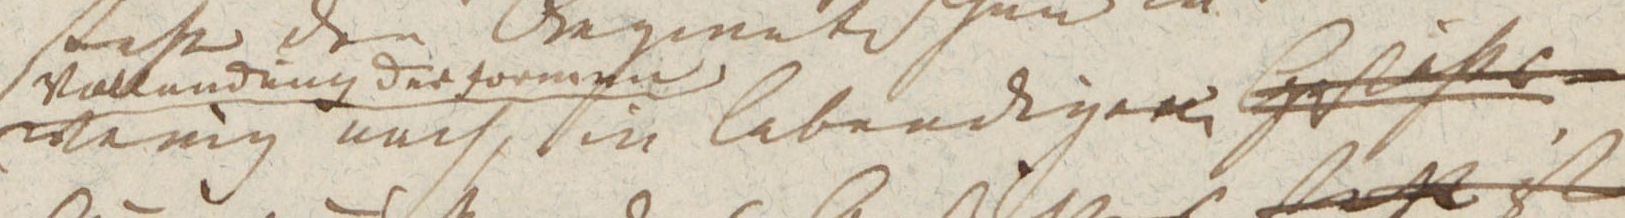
wenig nach, in lebendigerm Gesichts-
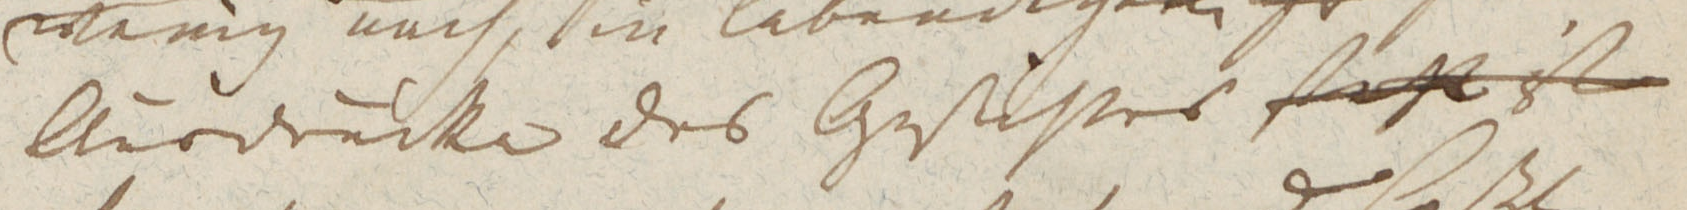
Ausdrucke des Gesichtes steht ist
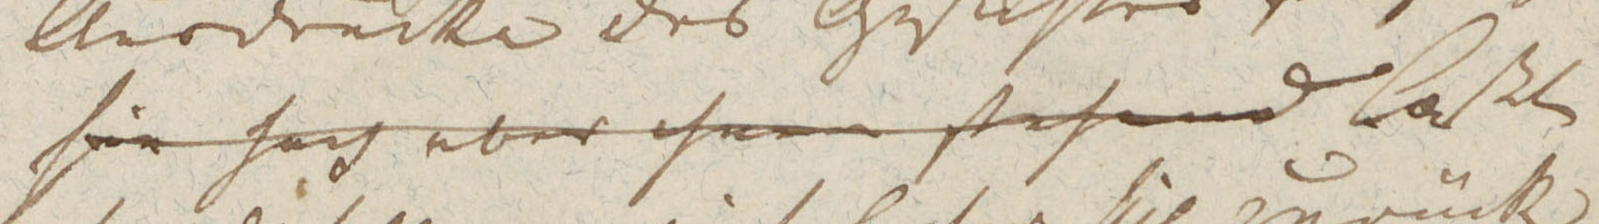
sie hoch uber ihnen stehend lasst
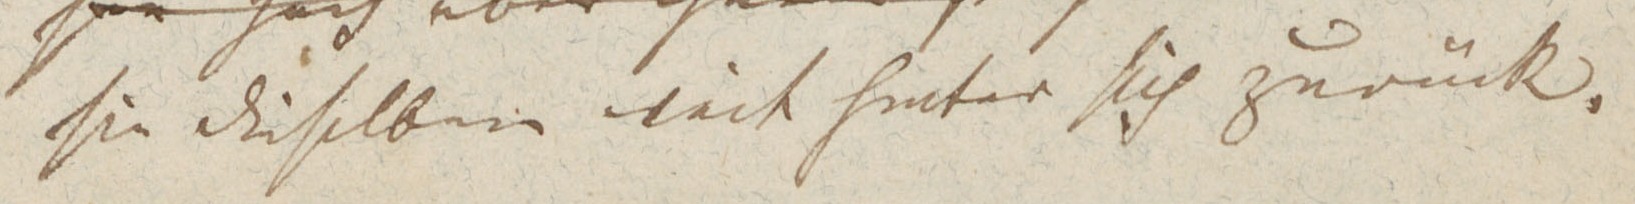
sie dieselben weit hinter sich zurück.
